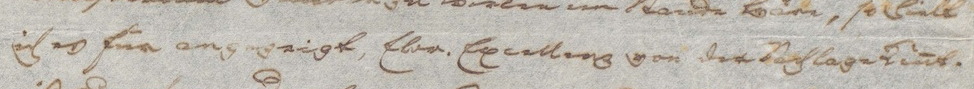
ich es für angezeigt, Ewr. Excellenz von der Sachlage Kennt-
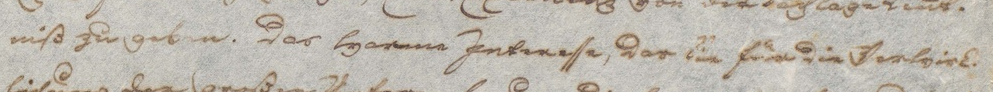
niß zu geben. Das warme Interesse, das Sie für die Verwirk-
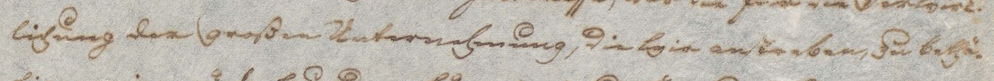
lichung der großen Unternehmung, die wir anstreben, zu bethä-
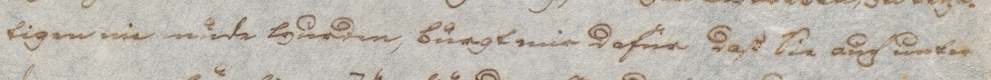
tigen nie müde wurden, bürgt mir dafür daß Sie auch unter
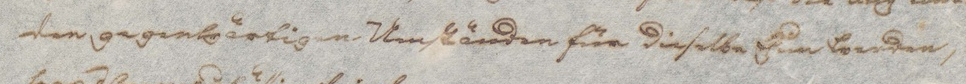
den gegenwärtigen Umständen für dieselbe thun werden,
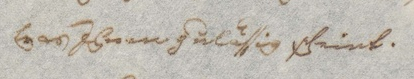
was Ihnen zulässig scheint.
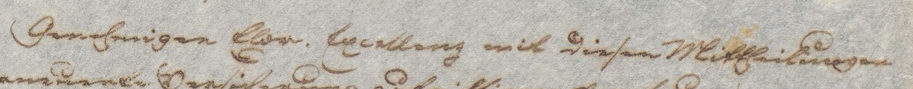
Genehmigen Ewr. Excellenz mit diesen Mittheilungen
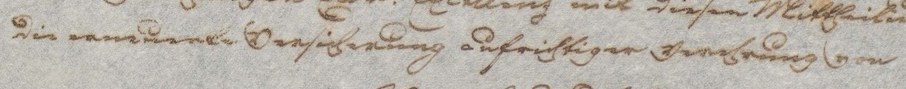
die erneuerte Versicherung aufrichtiger Verehrung von
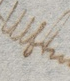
Escher
